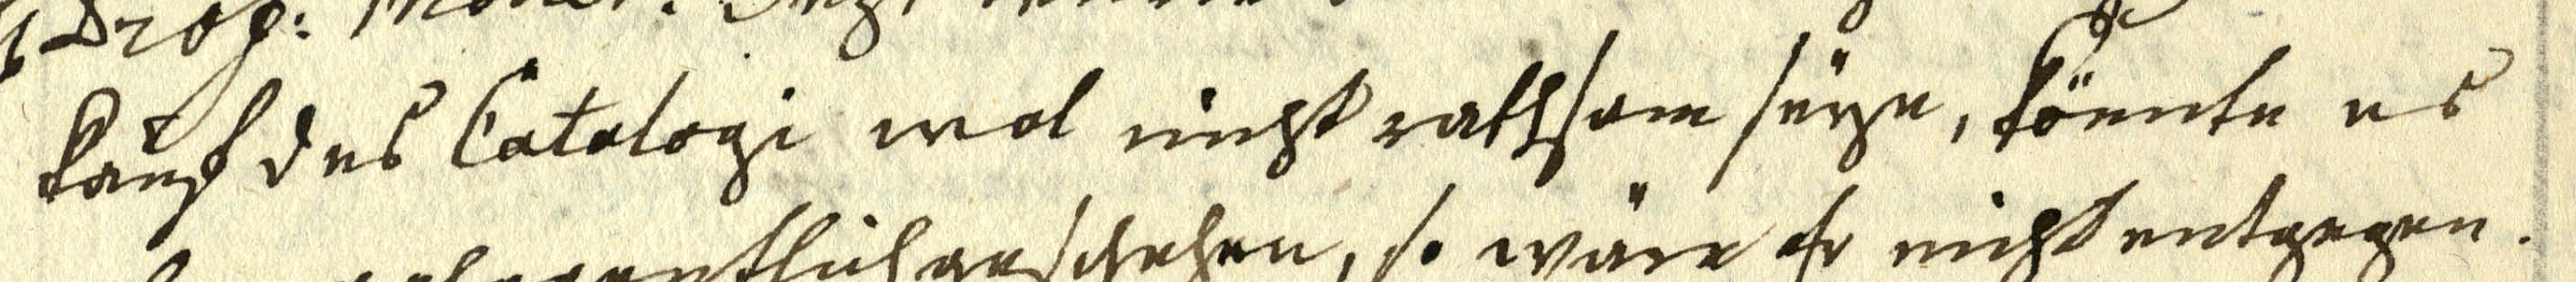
kauf das Catalogi wol nicht rathsam seÿn, könnte es
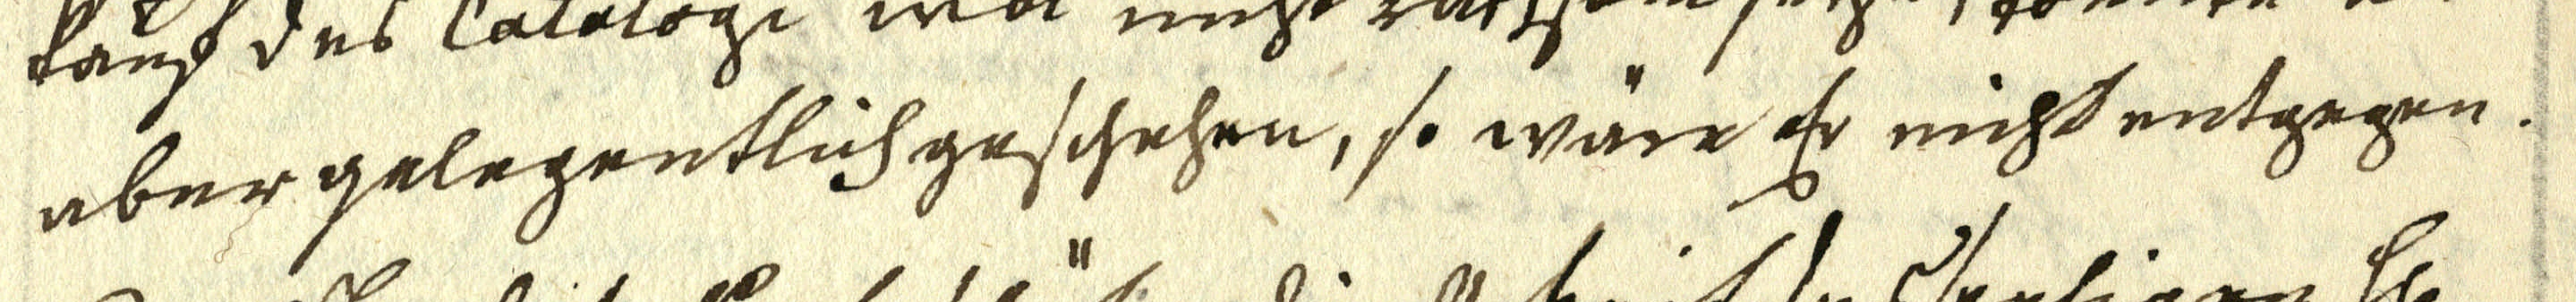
aber gelegentlich geschehen, so wäre Er nicht entgegen.
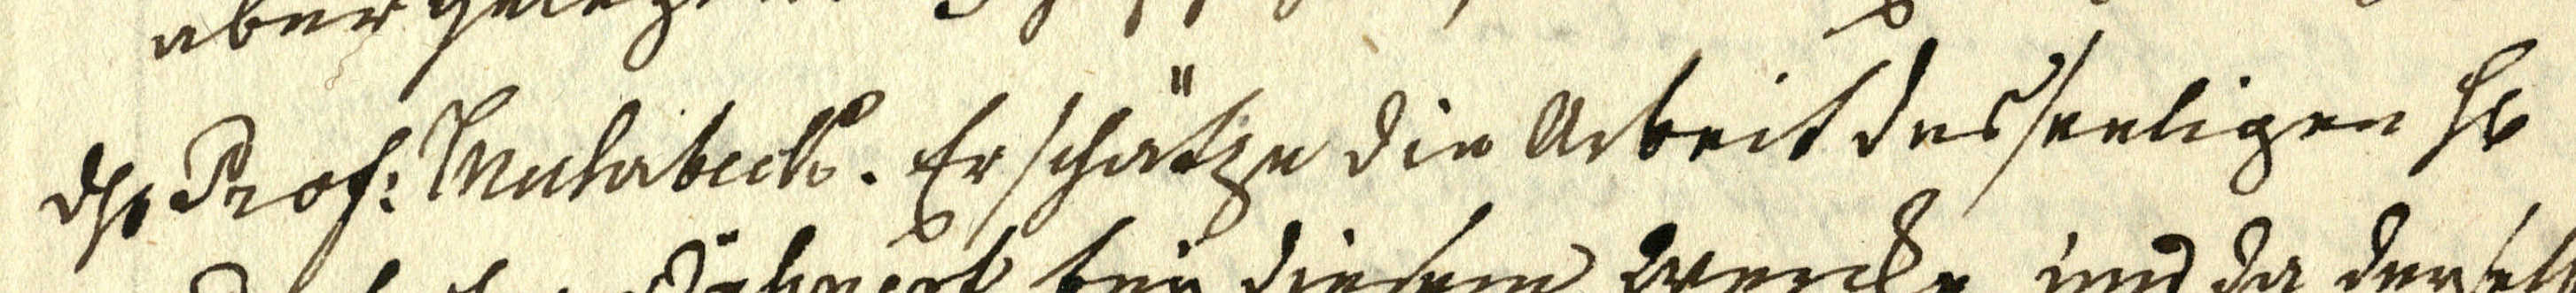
dh. Prof. Muhrbeck. Er schätze die Arbeit des seeligen H
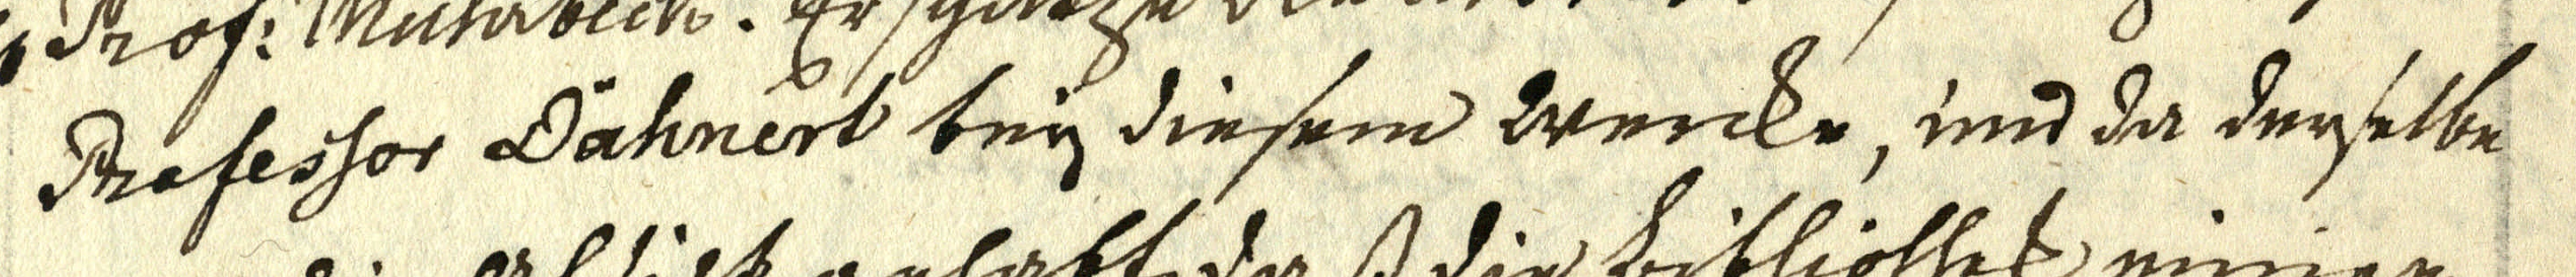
Professor Dähnert beÿ diesem Wercke, und da derselbe
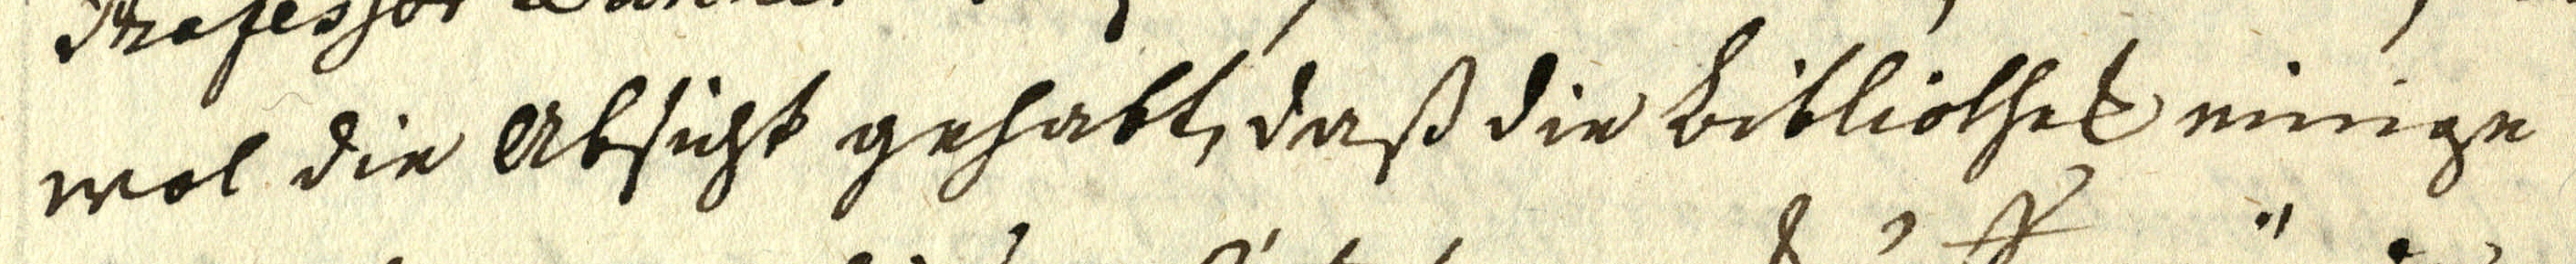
wol die Absicht gehabt, daß die Bibliothek einige
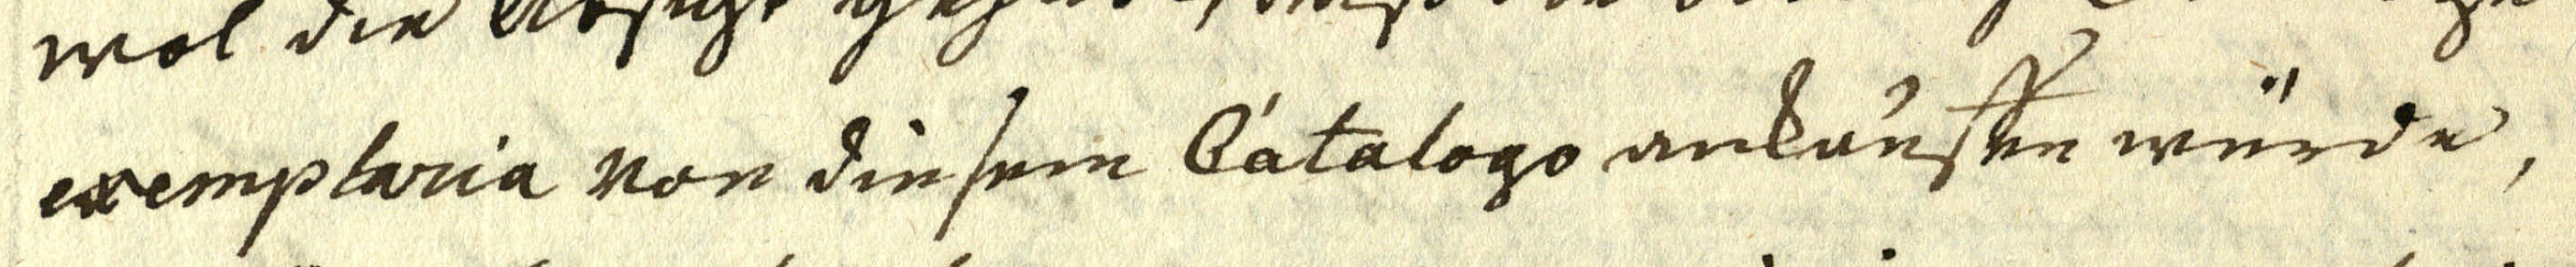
exemplaria von diesem Catalogo ackauffen würde,
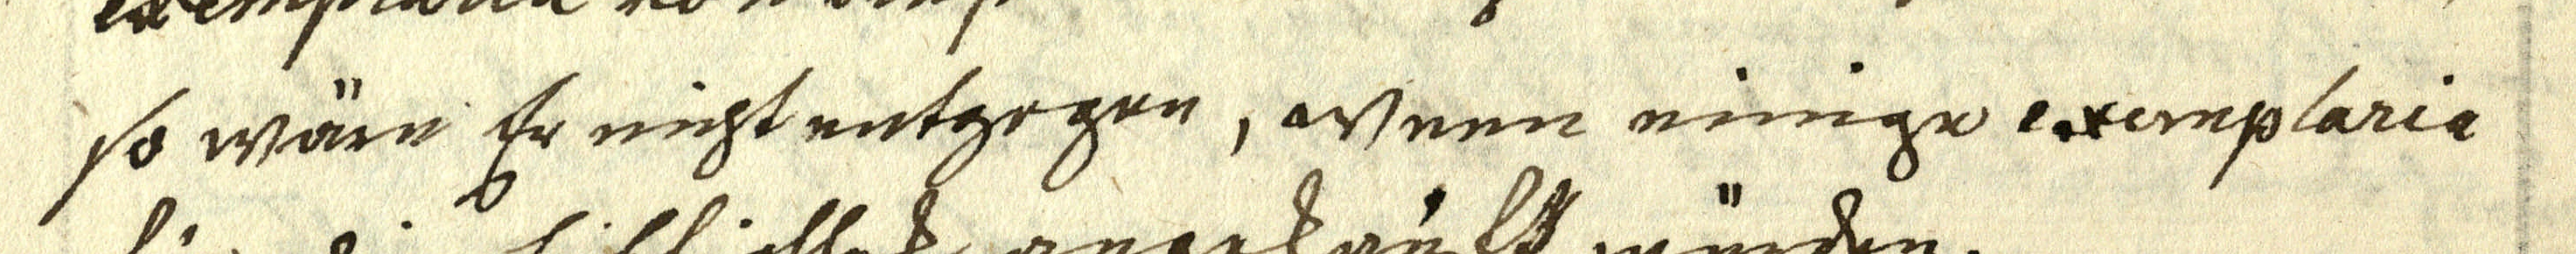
so wäre Er nicht entgegen, wenn einige exemplaria
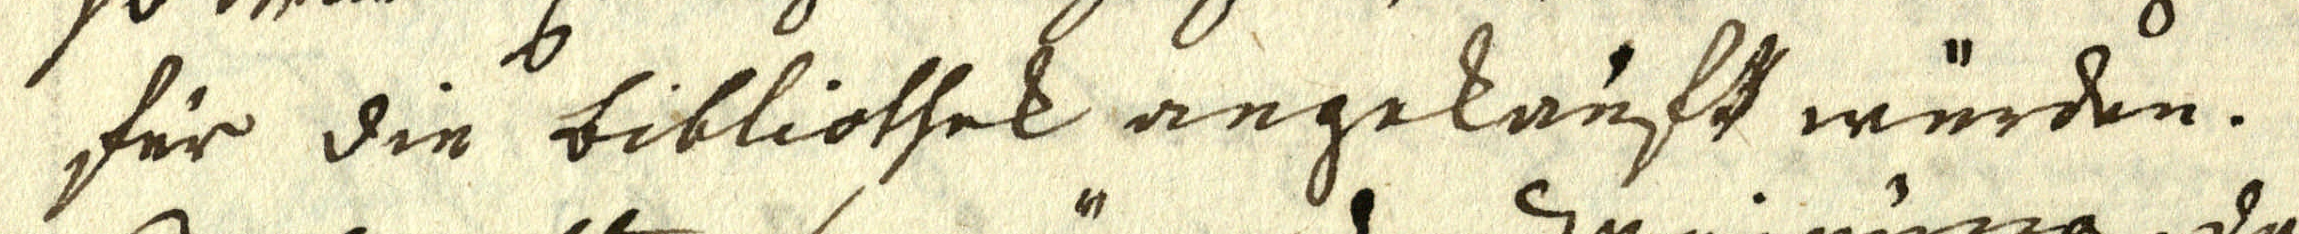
für die Bibliothek angekauft würden.
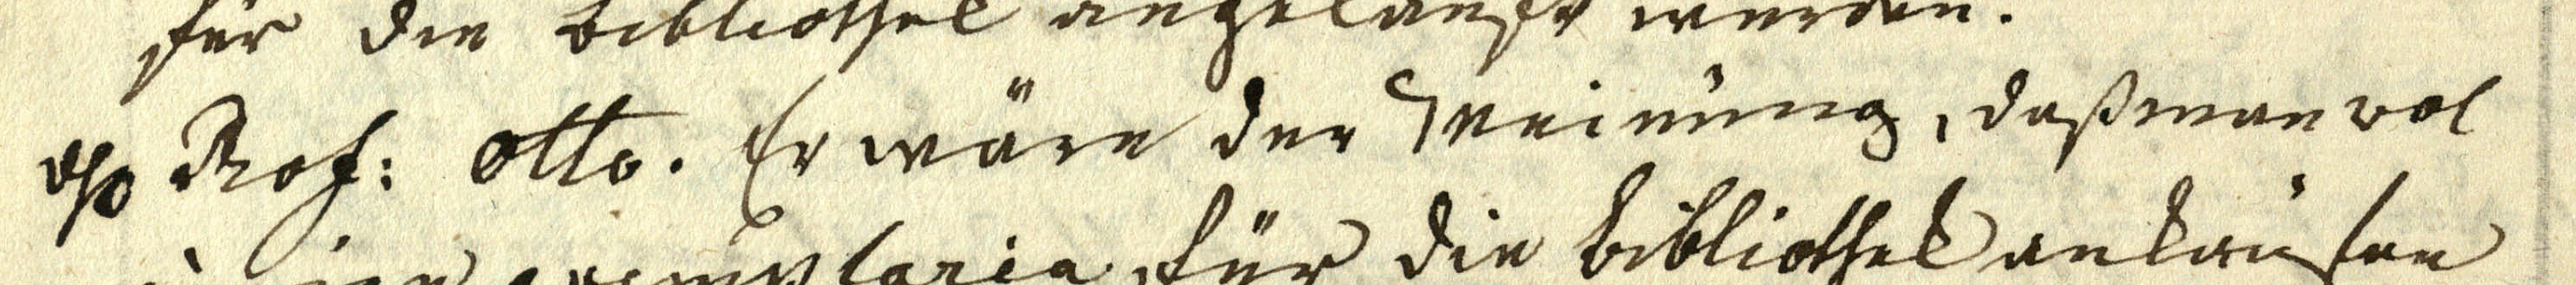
dh Prof. Otto. Er wäre der Meinung, daß man wol
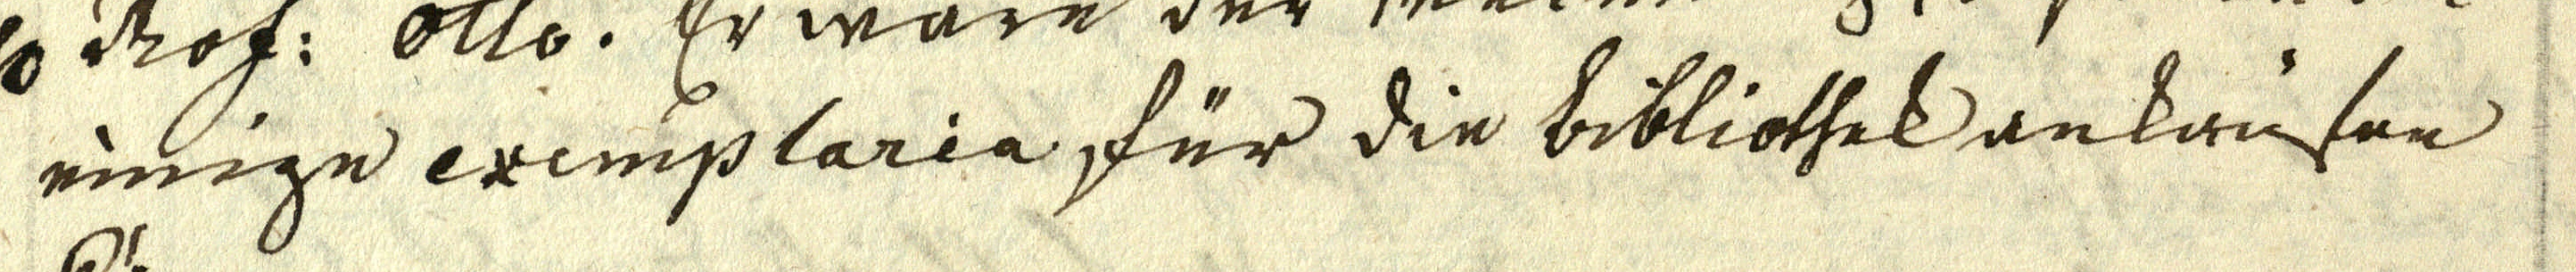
einige exemplaria für die Bibliothek ankaufen
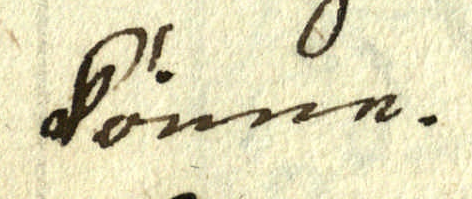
könne.
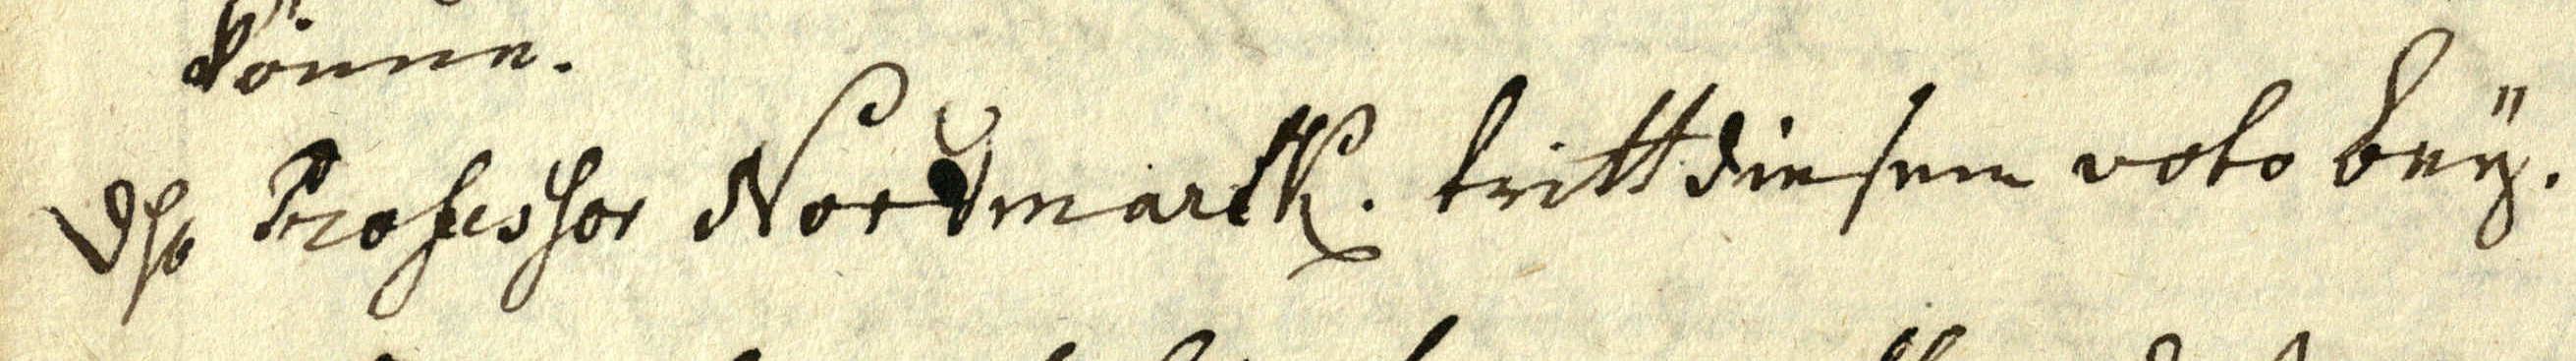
dh Professor Nordmarck. tritt diesen voto beÿ.
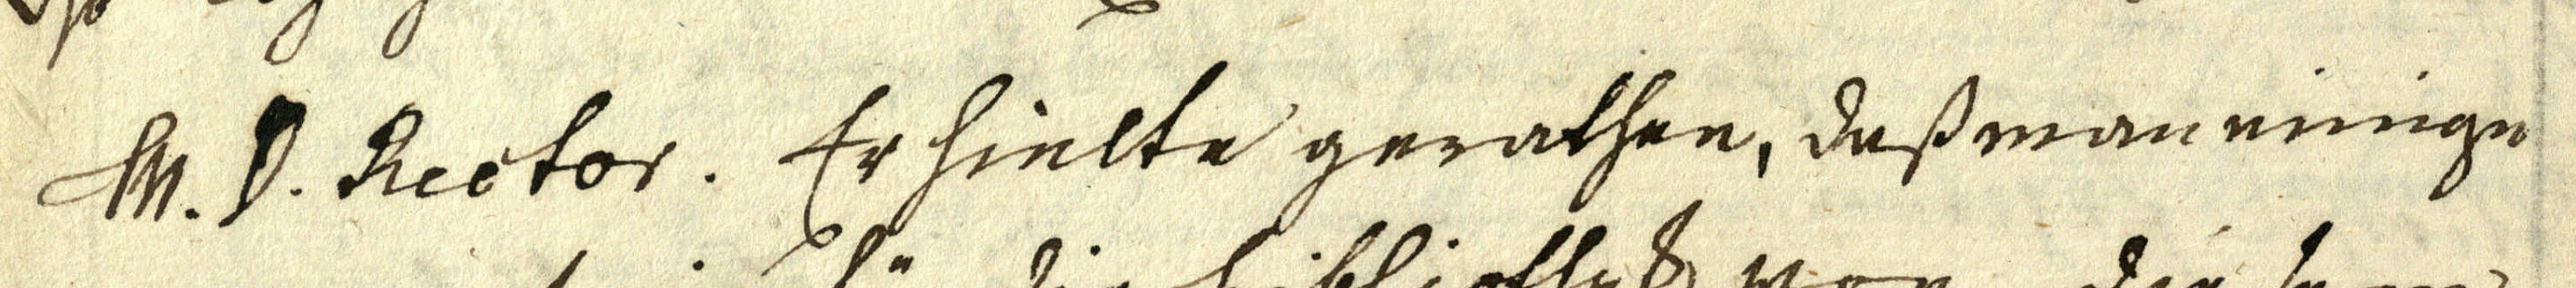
M. D. Rector. Er hielte gerathen, daß man einige
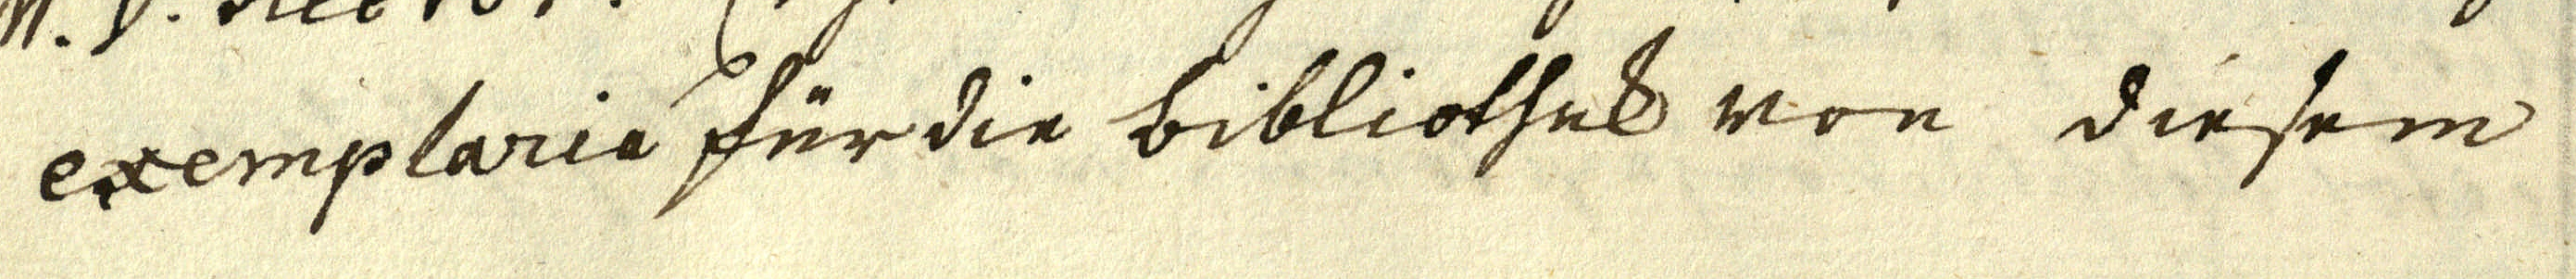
exemplaria für die Bibliothek von diesem
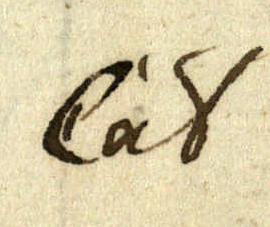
Cat
